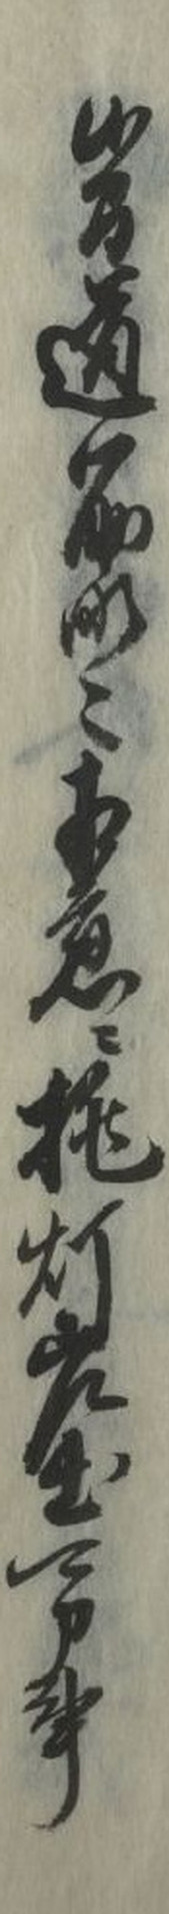候間道筋町々相応に挑灯差出可申事
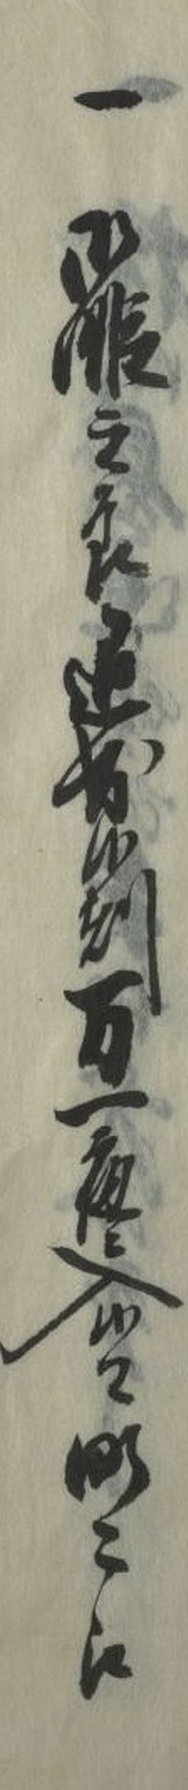一御暇之節退出候刻万一夜に入候はゝ町々え
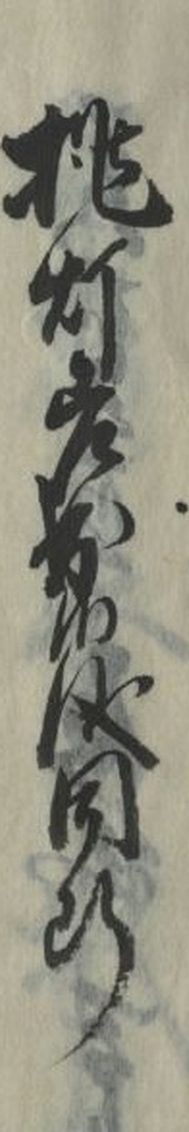挑灯差出候儀同断
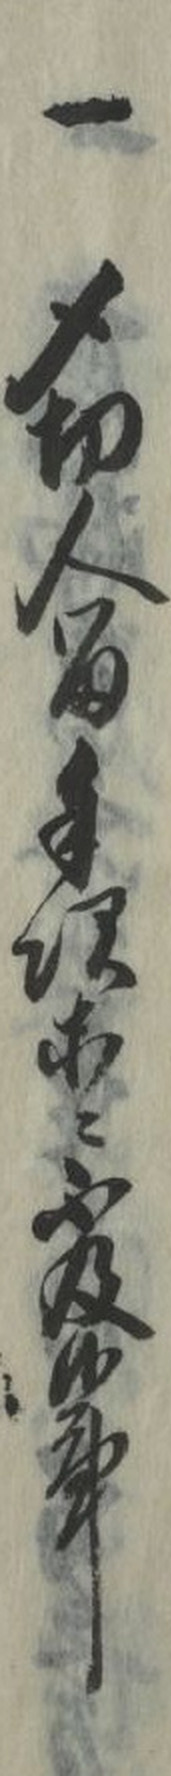一〆切人留手次等に不及候事
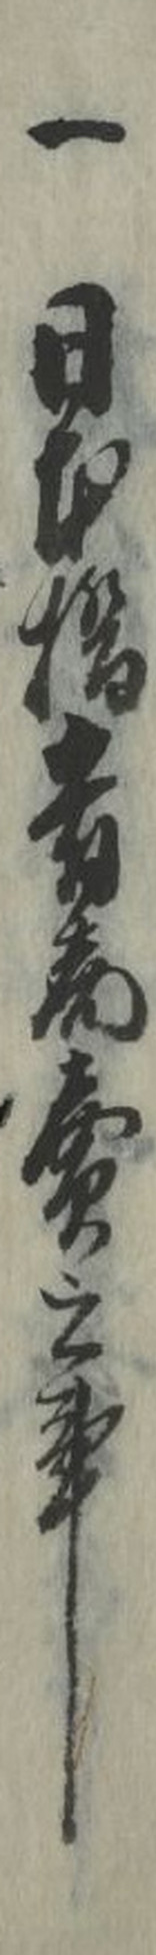一日本橋肴商売之事
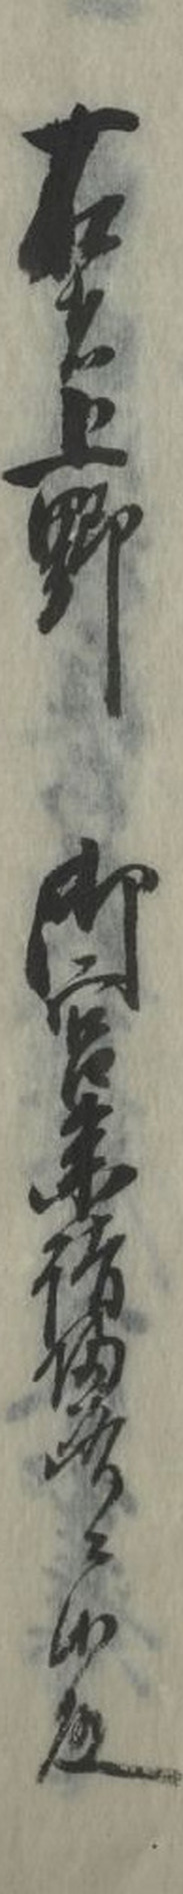右は上野御宮参詣帰路に候故
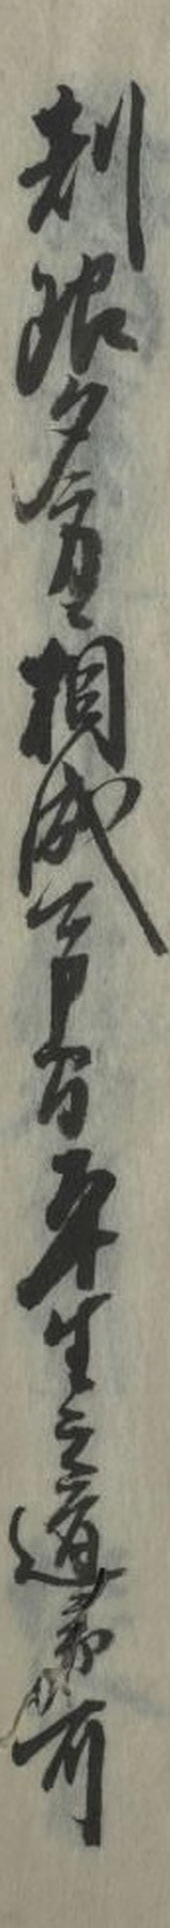刻限夕方に相成可申間平生之道筋可

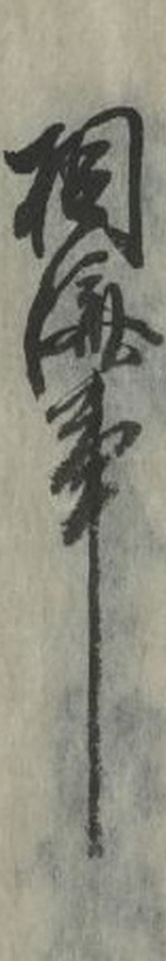相済事
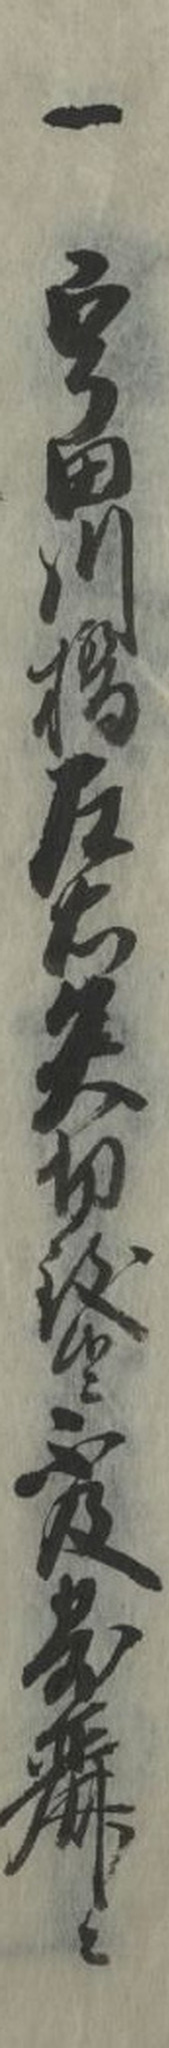一宇田川橋左右矢切致候に不及寄麗に
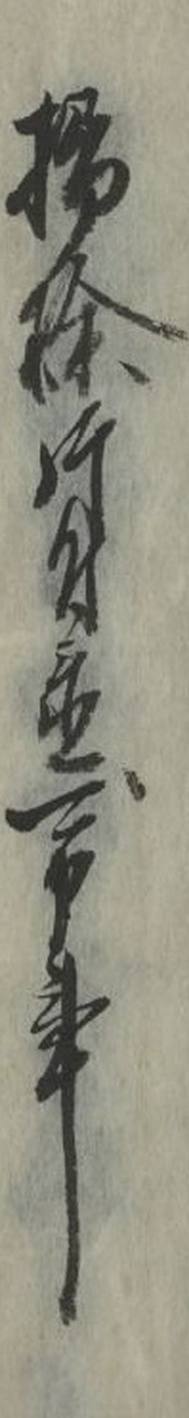掃除片付置可申事
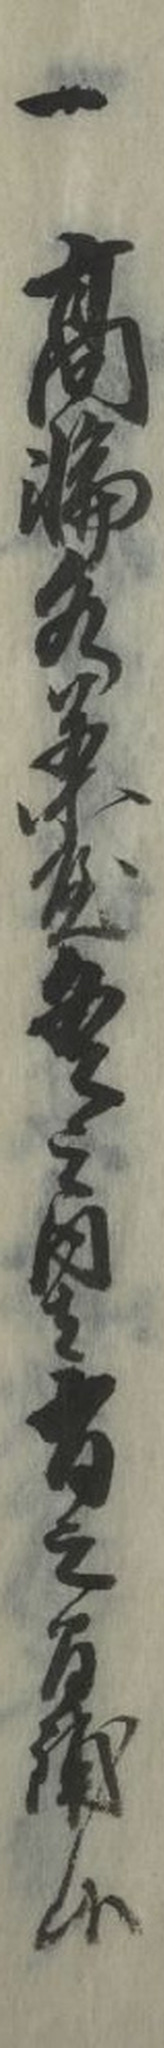一高輪水茶屋冬之内は有之間鋪候
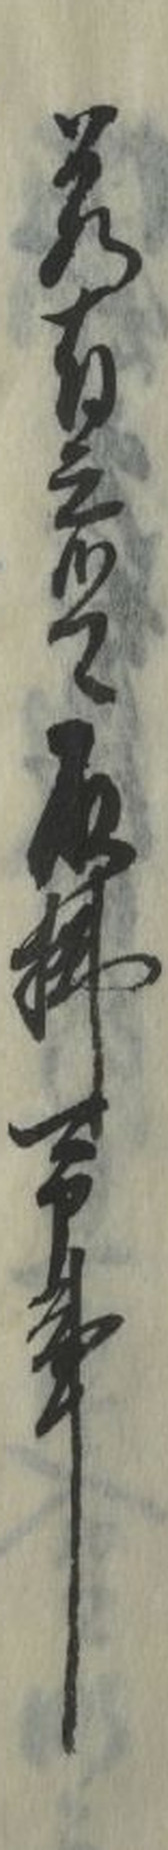若有之候はゝ取払可申事
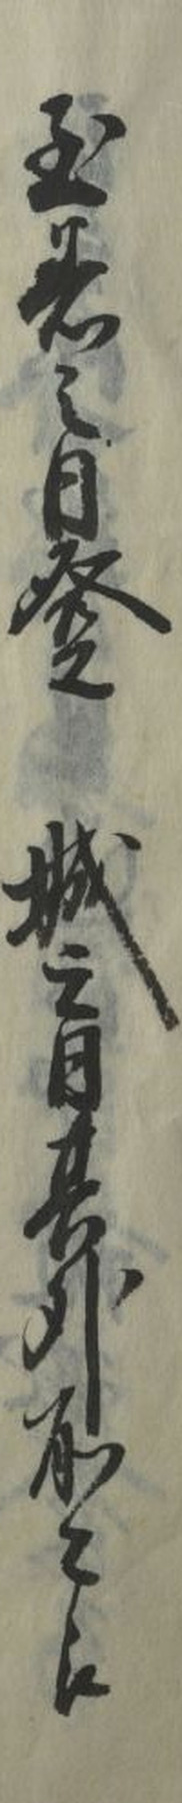至着之日登城之日其外所々え
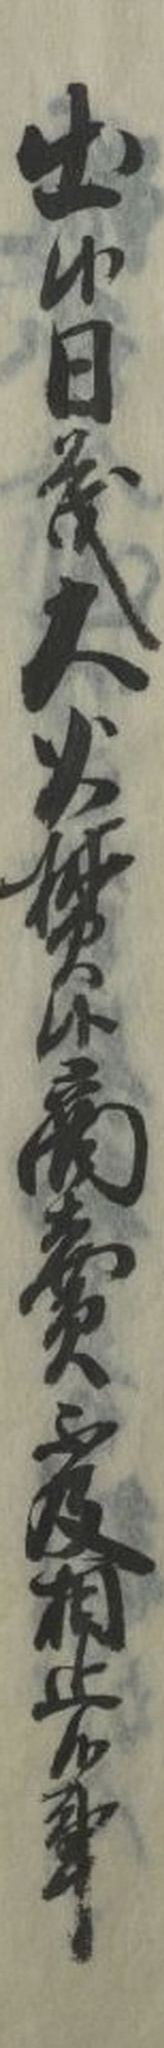出候日も大火焚候商売不及相止候事
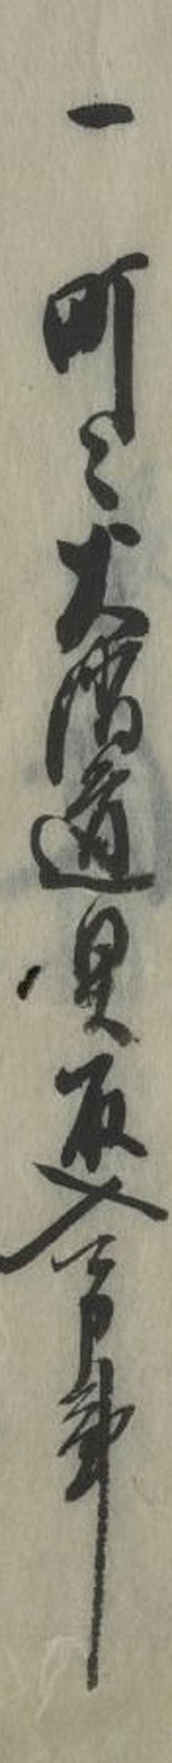一町々火消道具取入可申事
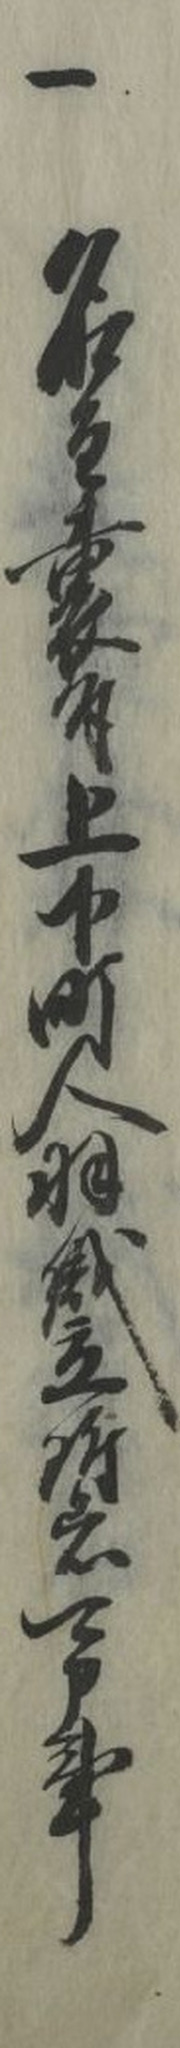一名主裏付上下町人羽織立附着可申事
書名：天保三壬辰年・琉球人参府・弐朱吹立御触写
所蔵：University of the Ryukyus Library
